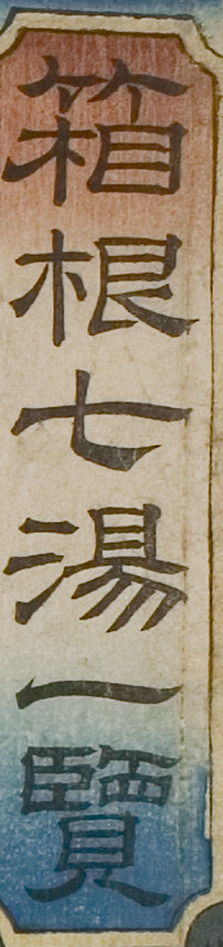箱根七湯一覧
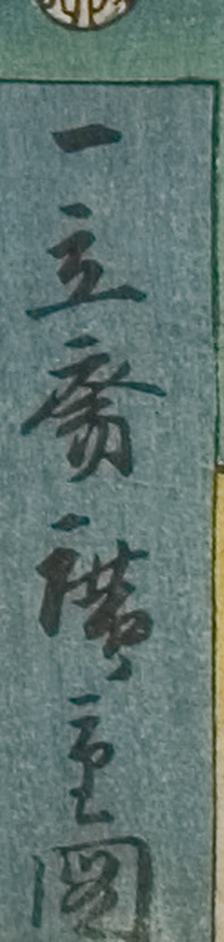一立斎廣重図

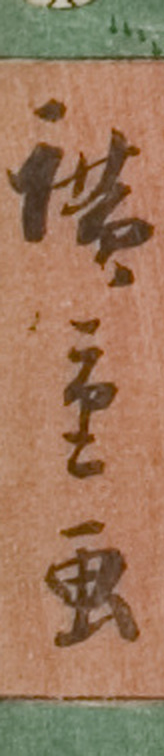廣重画
